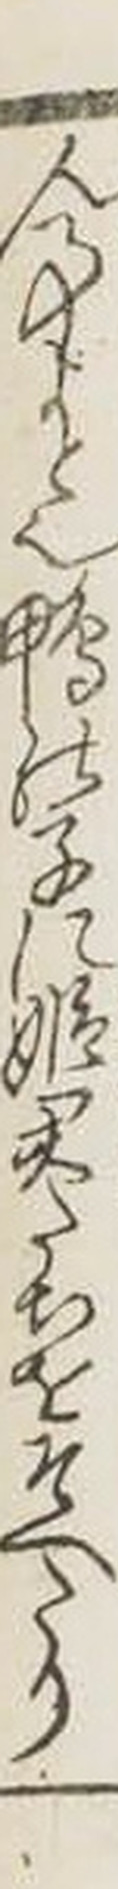ん事よと也鴨の子に姫君たちをそへたり
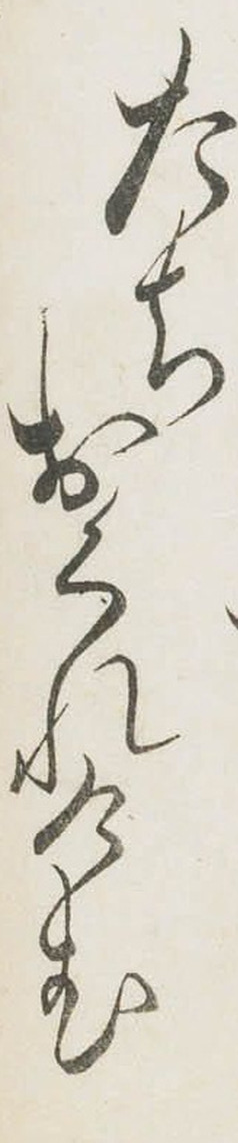おくれけむ
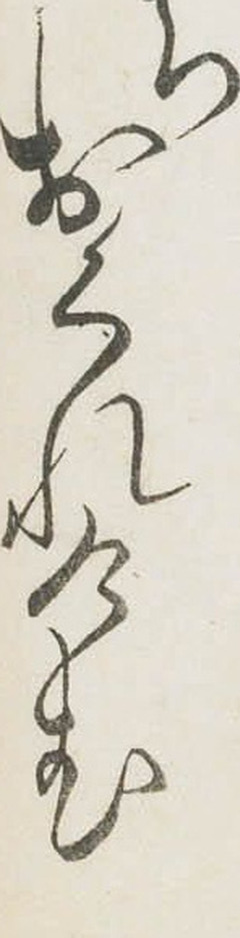おくれけむ
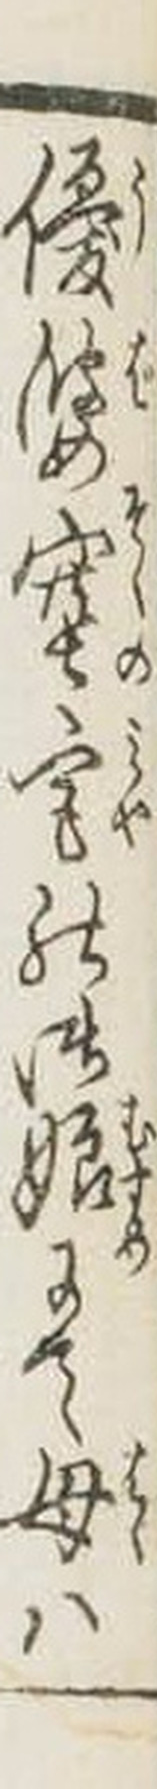優婆塞宮の御娘にて母は
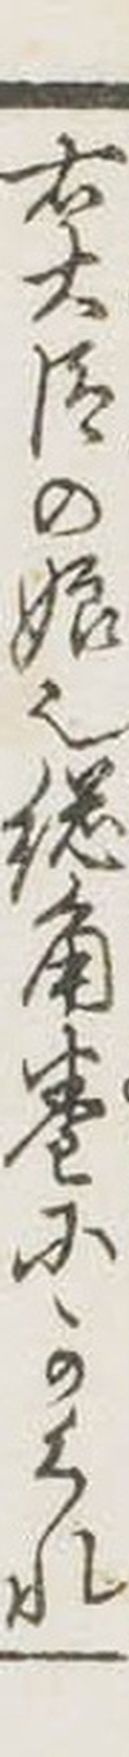右大臣の娘也総角巻にかくれ
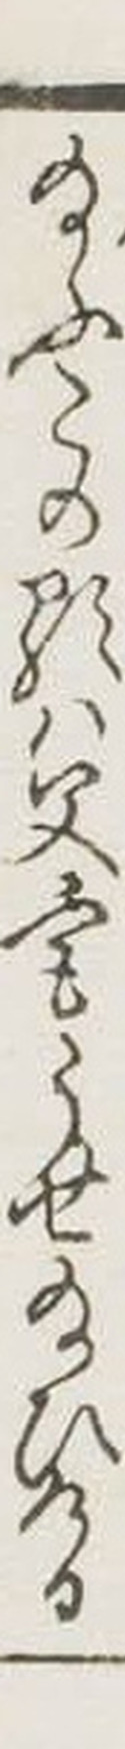給ふこの歌は父宮もうせ給ひける
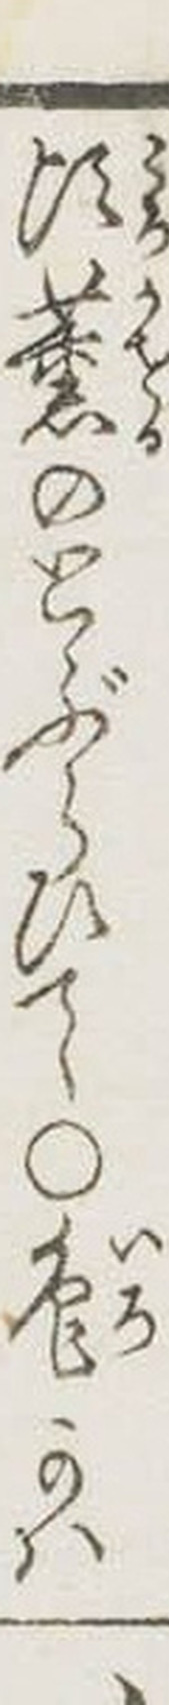頃薫のとぶらひて○色かは
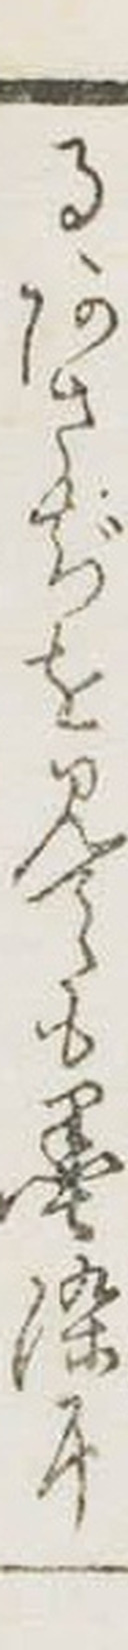るあさぢを見ても墨染に
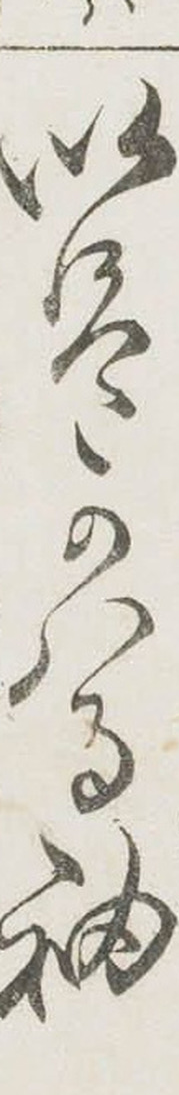いろかはる袖
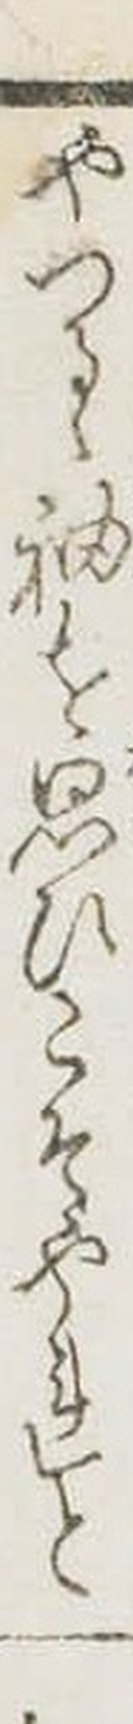やつるゝ袖を思ひこそやれと
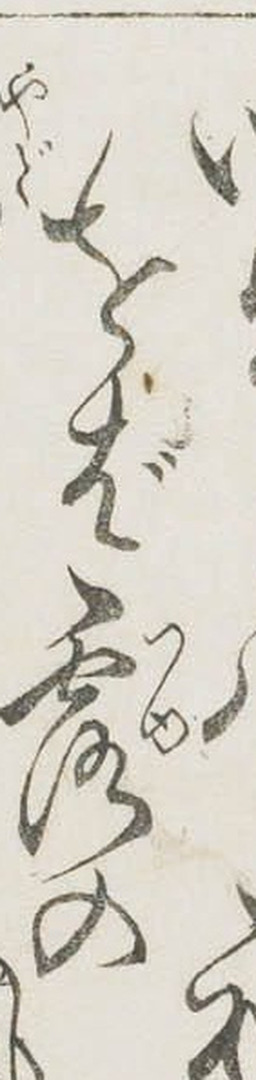をば露の
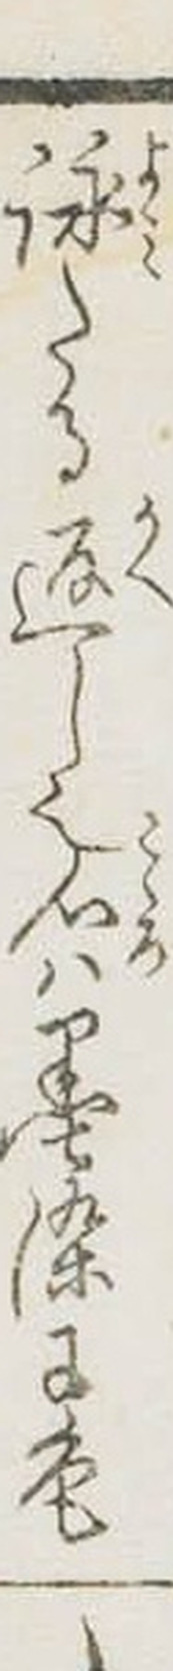詠たる返し也心は墨染に色
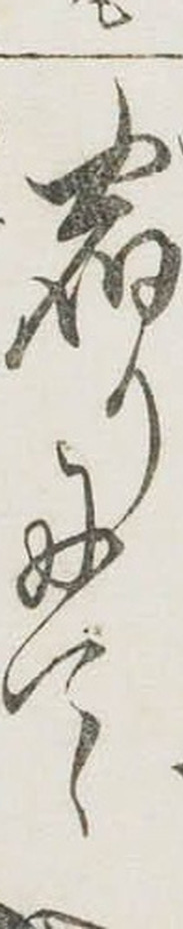宿りにて
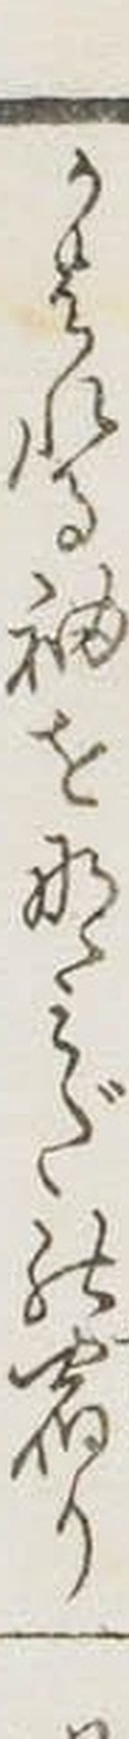かはれる袖をなみだの宿り
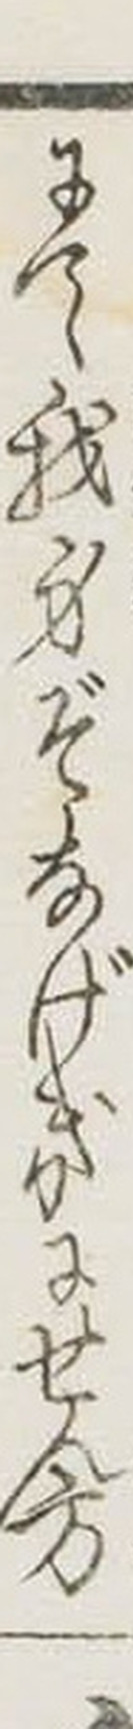にて我身ぞなげきにせん方
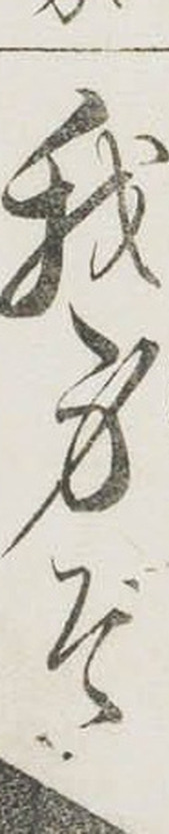我身ぞ
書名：源氏百人一首
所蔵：東京学芸大学教育コンテンツアーカイブ
